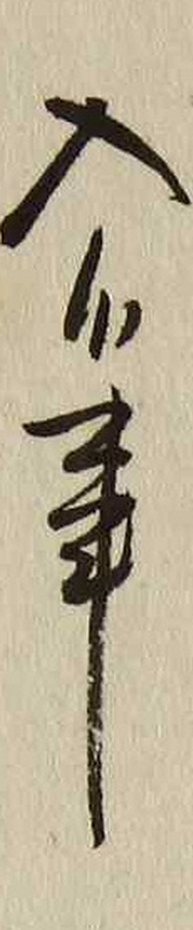入候事
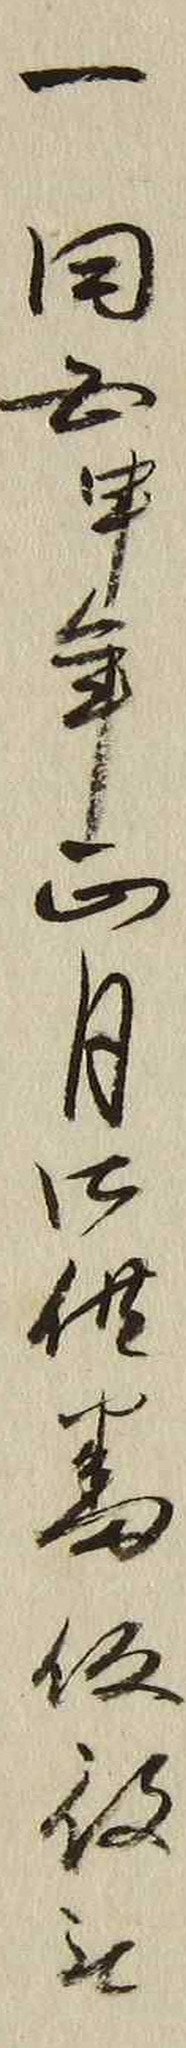一同五申年正月御供番仮役被
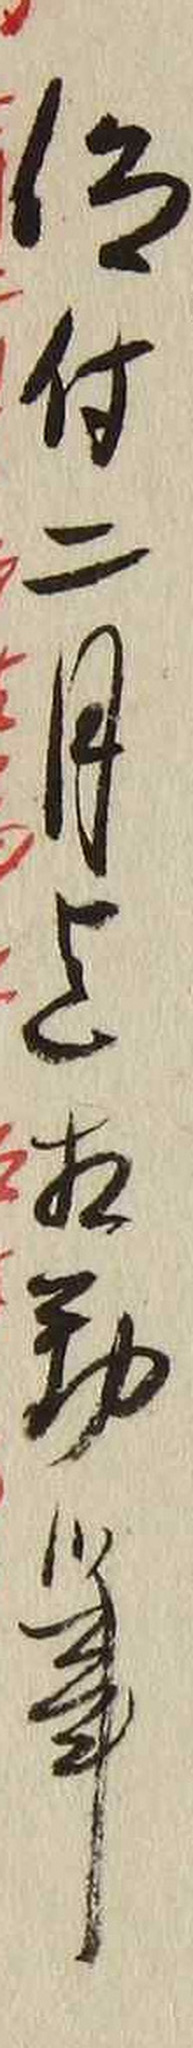仰付二月迄相勤候事
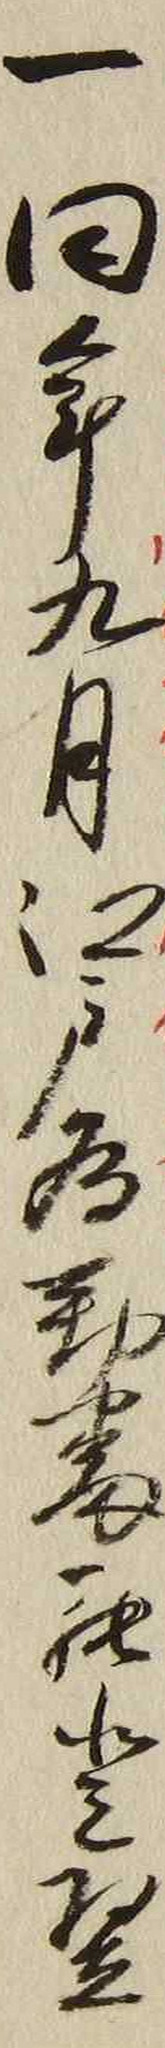一同年九月江戸為勤番罷登翌
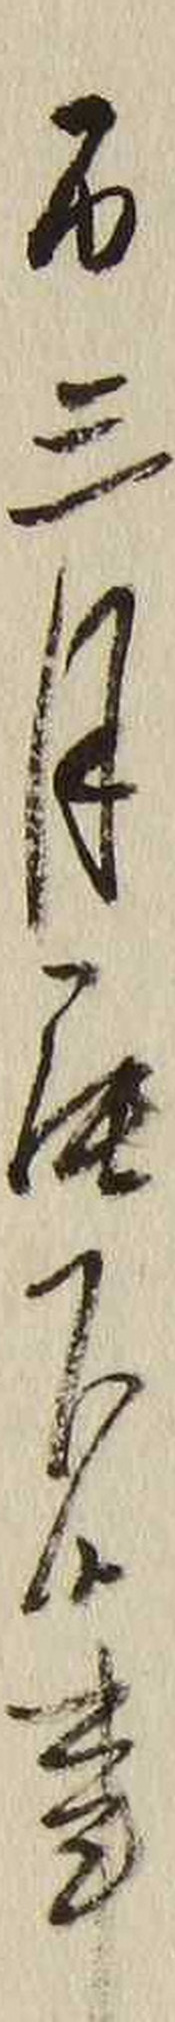酉三月罷下候事
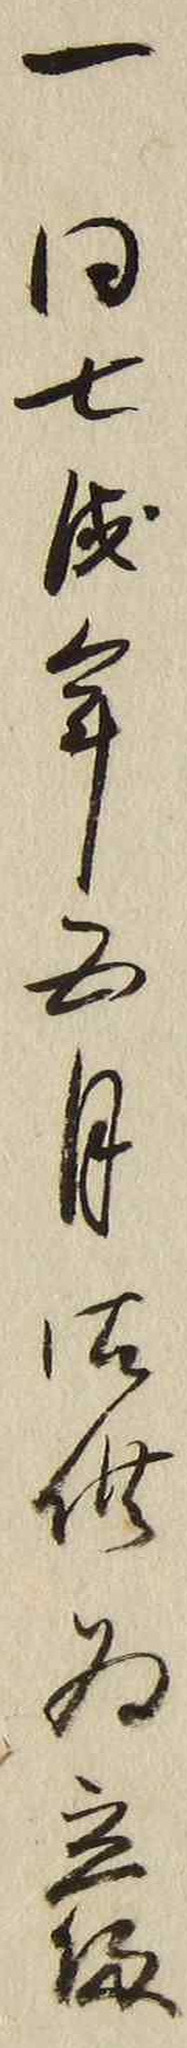一同七戌年五月御供為立帰

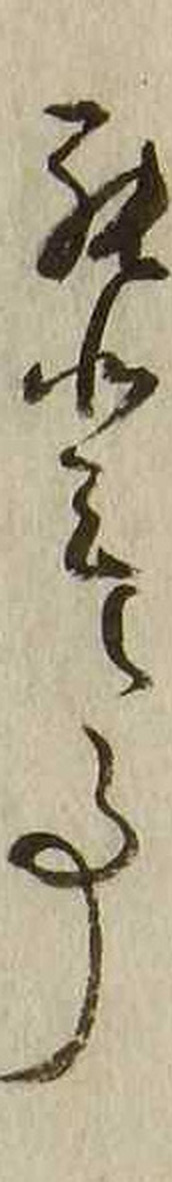罷登候事
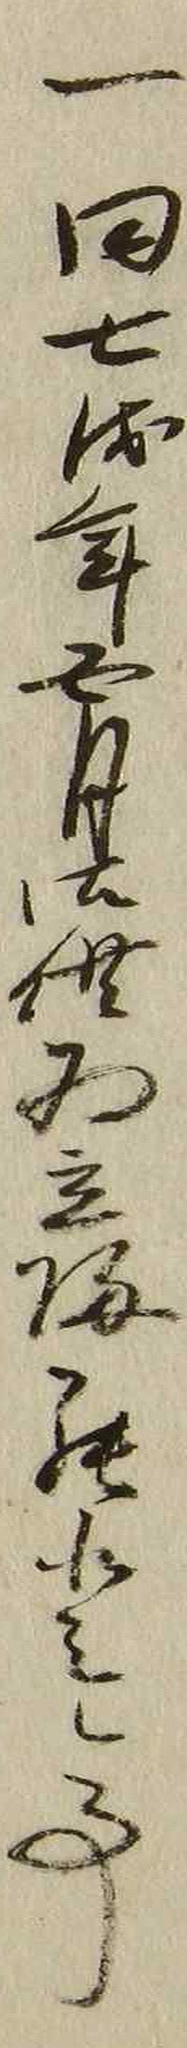一同七戌年五月御供為立帰罷登候事
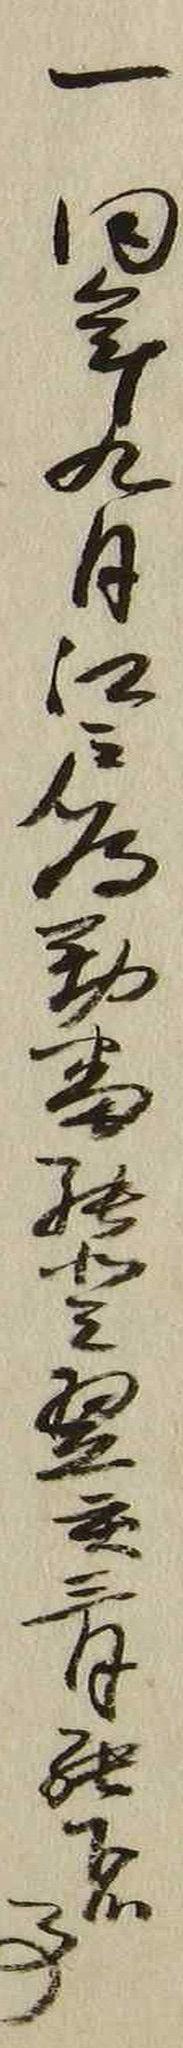一同年九月江戸為勤番罷登翌亥三月罷下候事
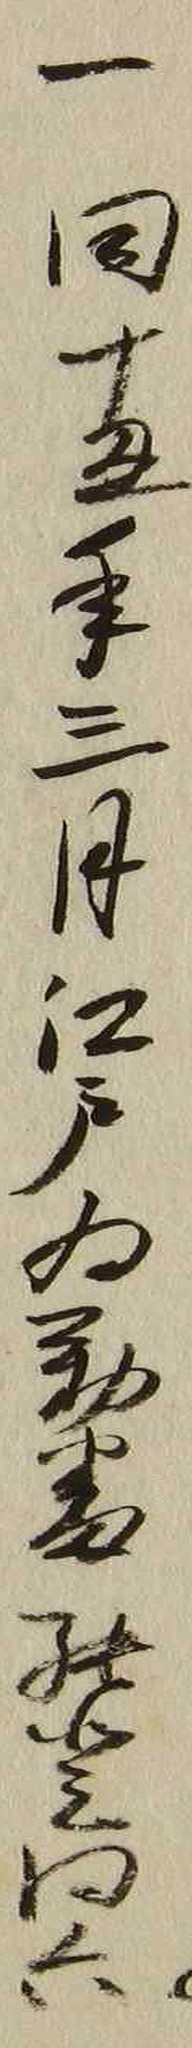一同十丑年三月江戸為勤番罷登同六
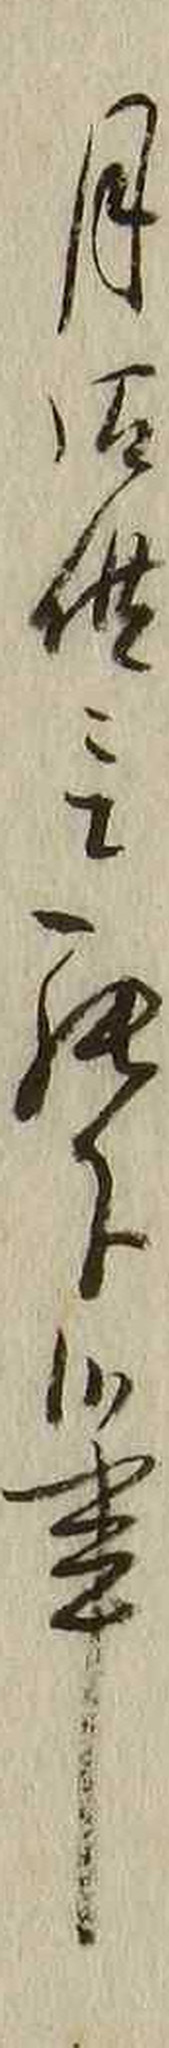月御供ニて罷下候事
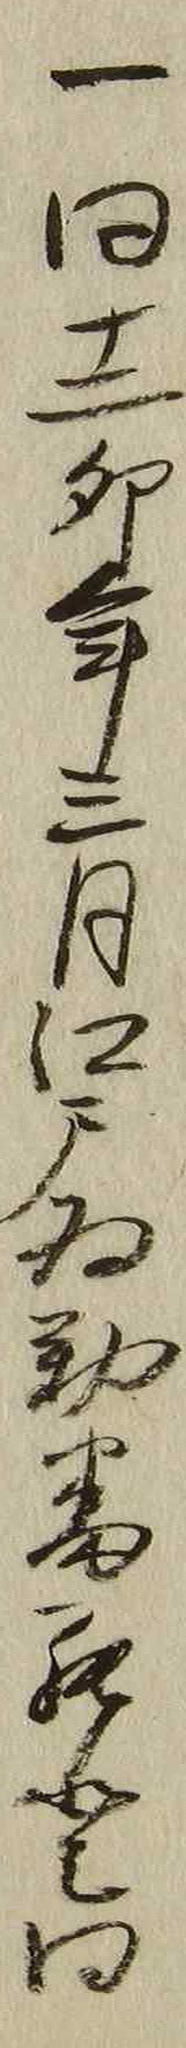一同十二卯年三月江戸為勤番罷登同
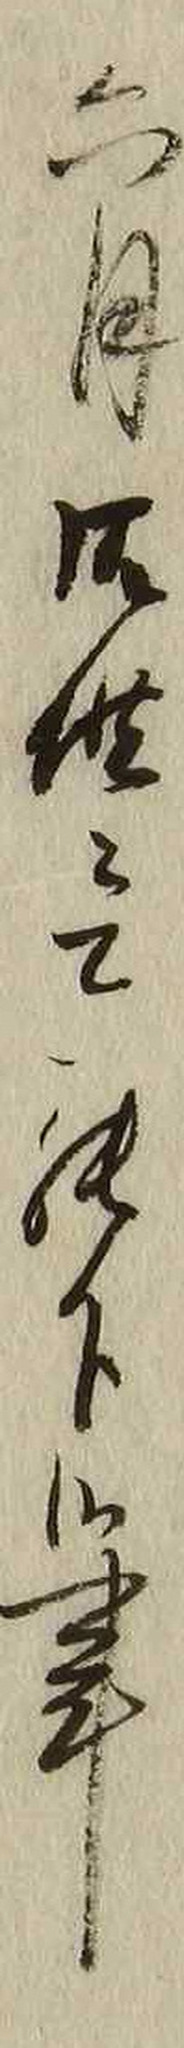六月御供ニて罷下候事
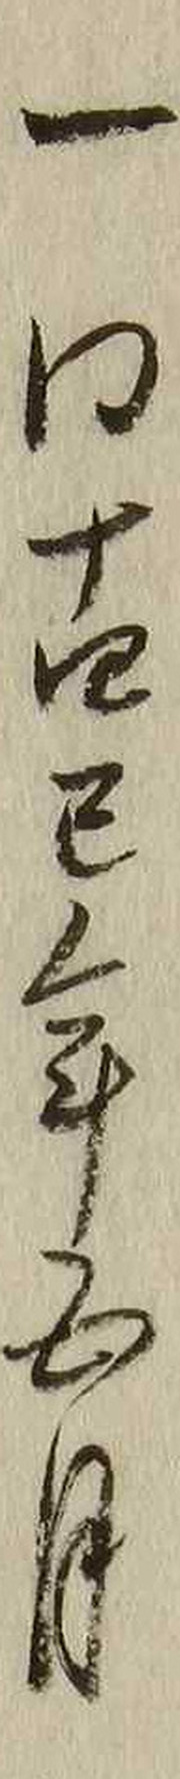一同十四巳年五月
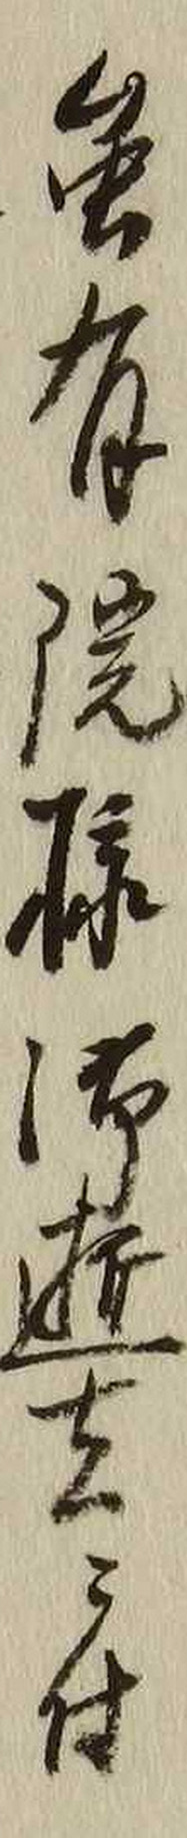雖有院様御逝去ニ付
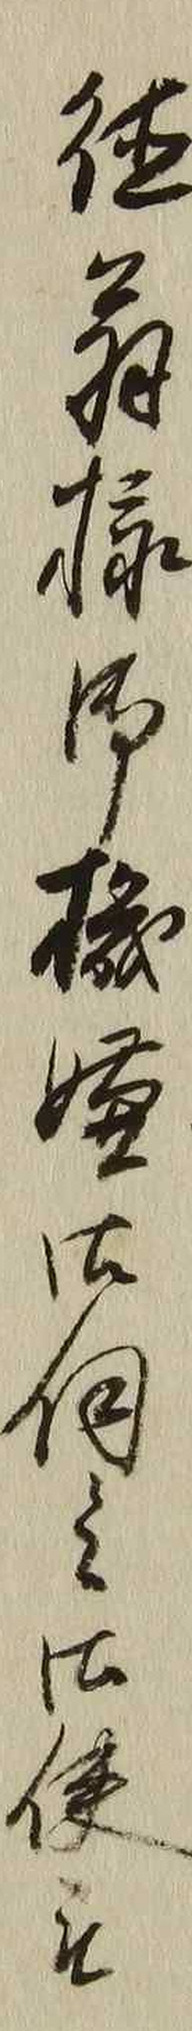徳翁様御機嫌御伺ニて御使被
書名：諸士系譜　巻之349　も之部5
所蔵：会津若松市立会津図書館
